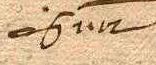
Snōr
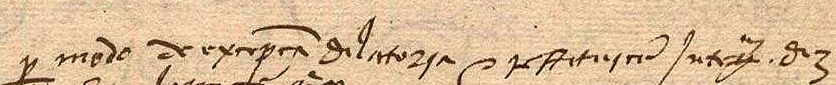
ꝑ modo de excepçā dilatorja e restitujçā Jntegm diz
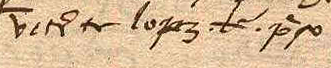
vicēte lopez R. p̄so
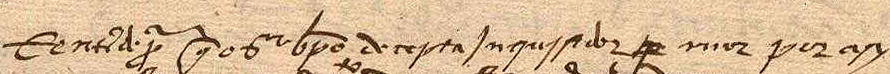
E entēde ꝓ̄ q̄ o sor bp̄o de cepta Jnqujsidor mor por asy
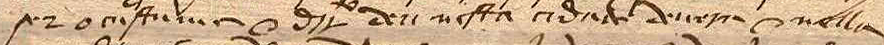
ser o custume e dirto deu nesta cidade deuora e nella
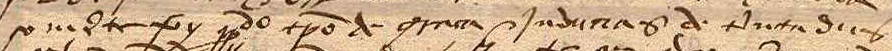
somēte foy ꝓpdo tp̄o de graça e Jnducias de tinta dias
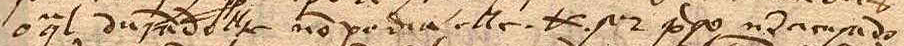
o q̄l durādo lhe n̄o podia elle R ser p̄so nē acusado
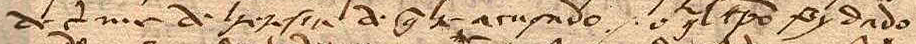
de cime de heresia de q̄ he acusado / o q̄l tpō foy dado
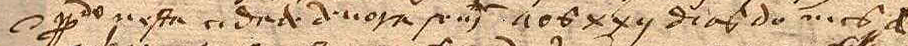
e ꝓpdo nesta cidade deuora somte aos xxij dias do mes de
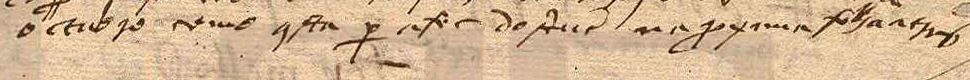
octubro como ꝯsta ꝑ a fee do sciuā na ꝓxima folha atras
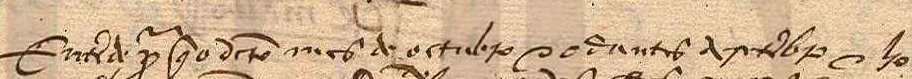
Entēde ꝓ̄ q̄ o dc̄to mes de octubro e o dantes de setēbro e ho
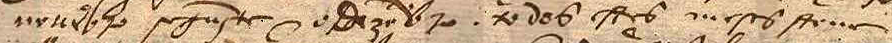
nouēbro seguj̄te e o dezēbro. todos estes meses steue
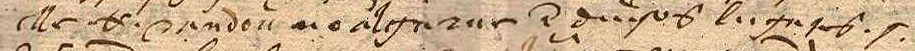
elle .R. e andou no algarue ē diūsos lugares .s.
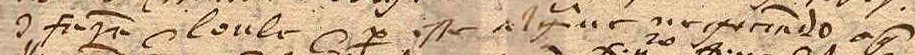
ē far̄a e loule e ꝑ este alḡue negociādo o q̄
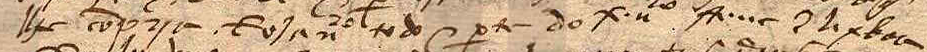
lhe c̄oprja. E o Janro todo e ꝑte do feuro steue ē lixboa
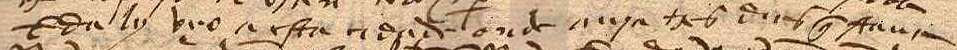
E daly veo a esta cidade onde auja tres dias q̄ estaua
